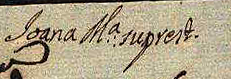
Ioana M.a suprest.
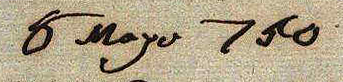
8 Mayo 750
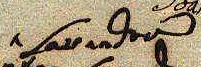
Lavandra
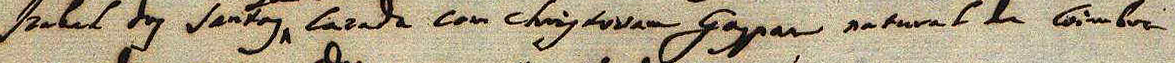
Jzabel dos santos, cazada com christovam Gaspar, natural da Coimbra
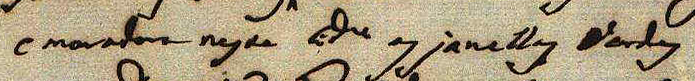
e moradora nesta Cide as janellas Verdes
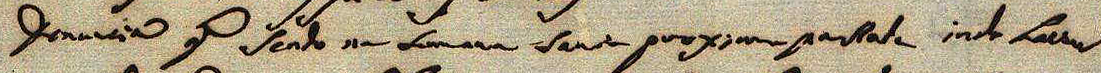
Denuncia q̄ sendo na semana santa proxima passada indo Lauar
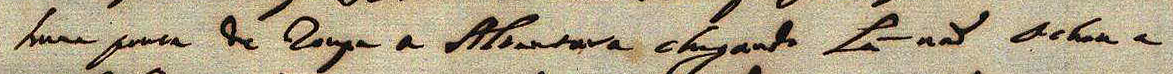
hum pouco de Roupa a Alcantara chegando Lá naõ achou a
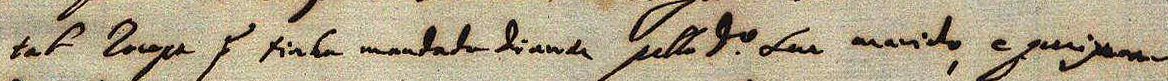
tal Roupa q̄ tinha mandado diante pello d.o Seu marido, e queixan
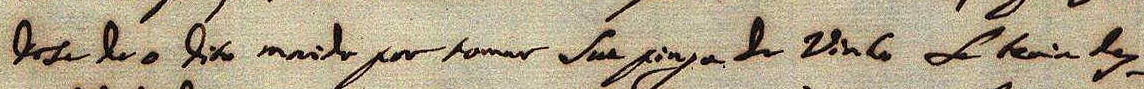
dose de o dito marido por tomar sua pinga de Vinho se teria des
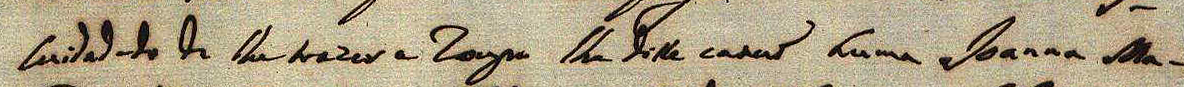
Cuidadado de lhe trazer a Roupa lhe disse cataõ huma Ioanna Ma
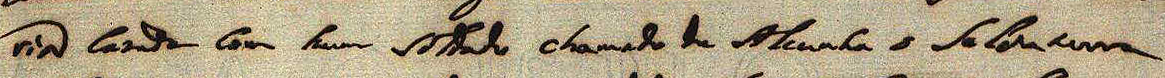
ria Cazada com hum soldado chamado da Alcunha o saluaterra
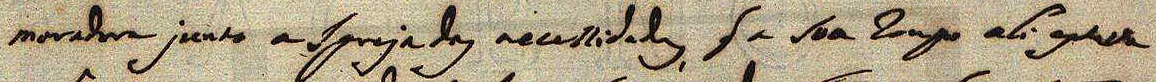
moradora junto a Igreja das necessidades, q̄ a sua Roupa ali estava
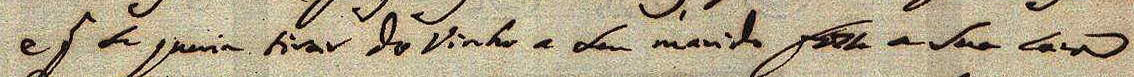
e q̄ se queria tirar do vinho a seu marido fosse a sua caza
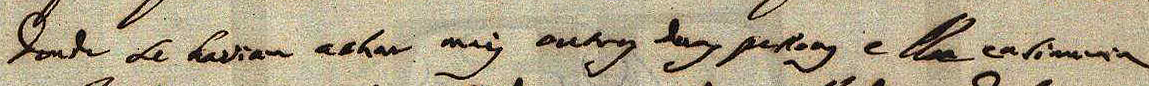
donde se haviam achar mais outras duas pessoas e lhe ensinaria
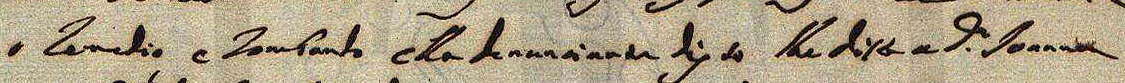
o Remedio e Zombando ella denunciante disto lhe disse a d.a Ioanna
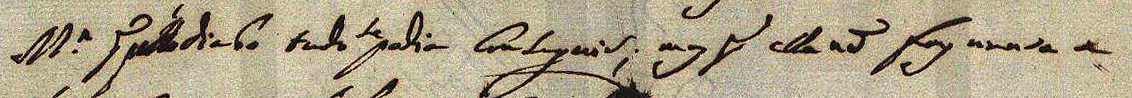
M.a q̄ pello diabo tudo se podia Conseguir; mas q̄ ella naõ foy nunca a
